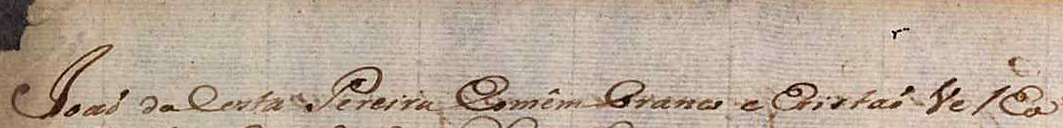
Ioaõ da Costa Pereira homêm branco e Cristaõ Velho
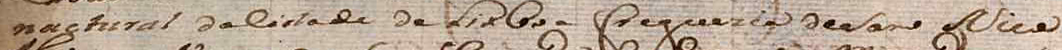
natural da Cidade de Lixboa freguezia de Sam Nico
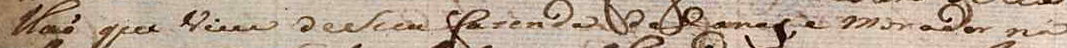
llaó que Viue de sua fazenda da canas, e morador na
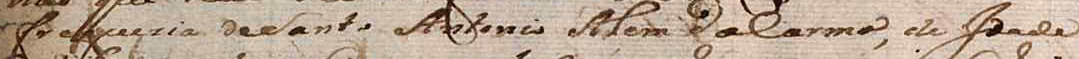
freguezia de Santo Antonio Alem do Carmo, de Jdade
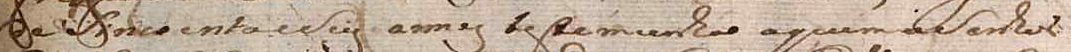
de Sincoenta e Seis annos testemunha a quem o Senhor
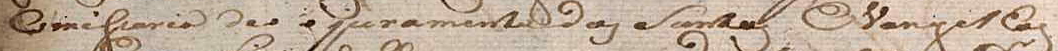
Comissario deo o juramento das Santoz EVangelhos
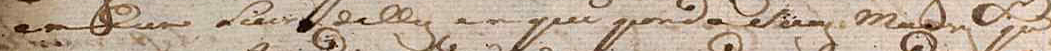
em hum Liuro delles em que pondo suas maons ju
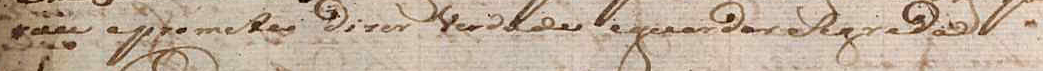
rou e prometeo dizer verdade e guardar segredo
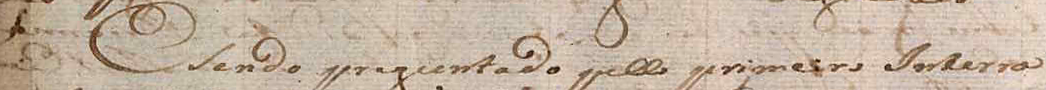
E sendo preguntado pello primeiro Interro
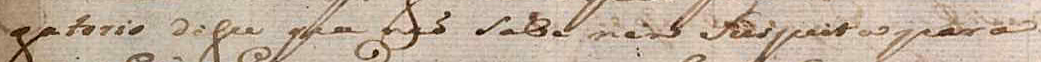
gatorio disse que naõ sabe nem suspeita para
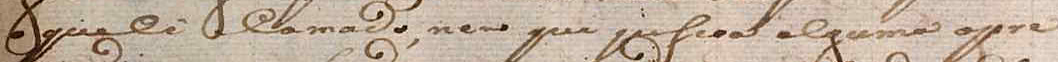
que hê chamado nem que pessoa alguma o pre
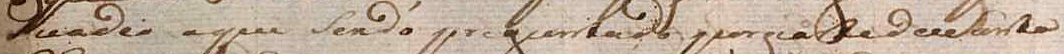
suadio e que sendo preguntado por parte do Santo
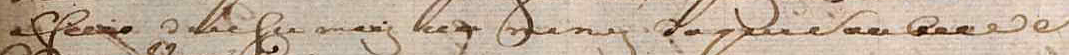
ofecio dicesse mais uo menos do que Soubece e
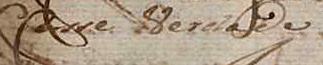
fosse Verdade
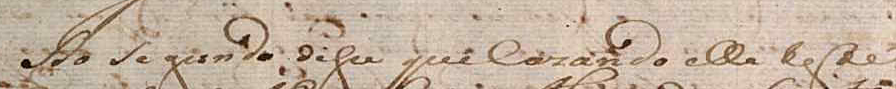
Ao segundo disse que Cazando elle teste
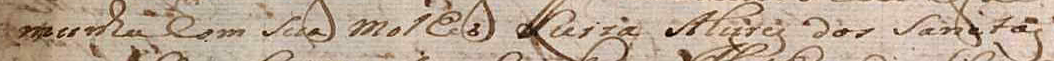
munha com sua molher Luiza Alures dos Sanctos
